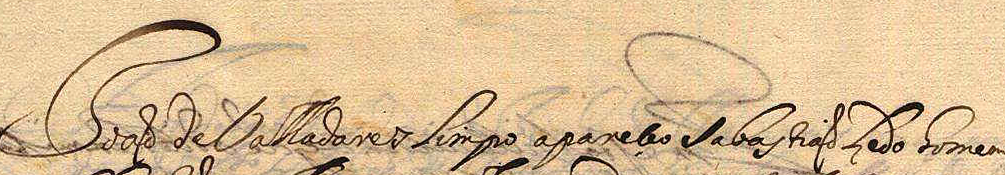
Ioaõ de Valladares Limpo apareçeo sabastiaõ Ledo homem
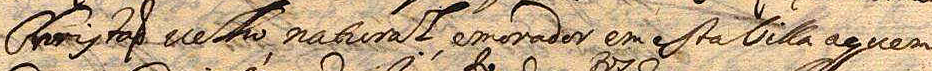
Christaõ uelho, natural, e morador em esta Villa a quem
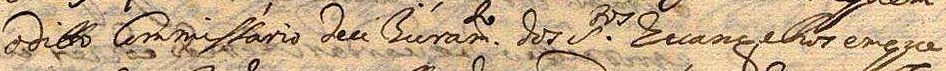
o ditto Commissario deu Iuram.to dos S.tos Euangelhos em que
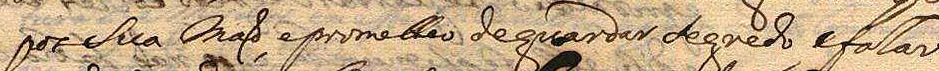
pos Sua Maõ, e prometteo de guardar segredo, e falar
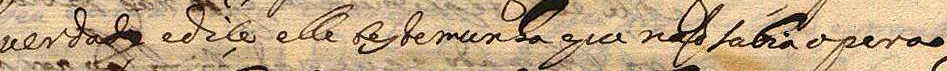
uerdad_, e diçe elle testemunha que naõ sabia o pera
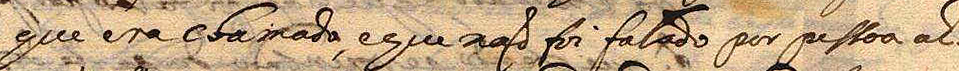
que era chamado, e que naõ foi falado por pessoa al
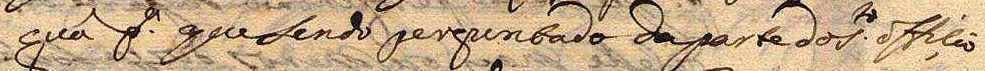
guā p.a que sendo perguntado da parte do s.to offiçio
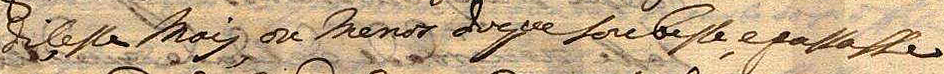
diÇesse mais, ou menos do que soubesse, e passasse
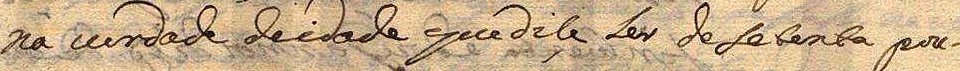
na uerdade de idade que diçe ser de setenta pou
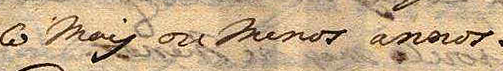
co mais ou menos annos.
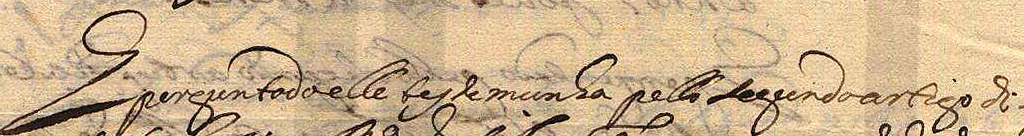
E perguntado elle testemunha pello segundo artigo di
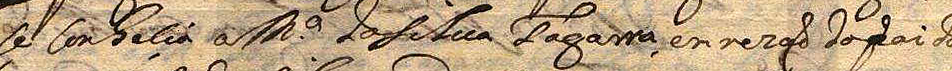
çe Conheçia a M.a da Silua Tagarra, em rezaõ do pai da
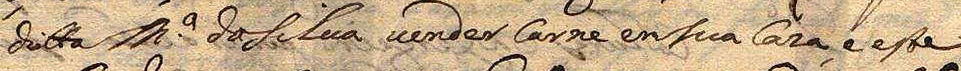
ditta M.a da Silua uender carne en sua caza, e este
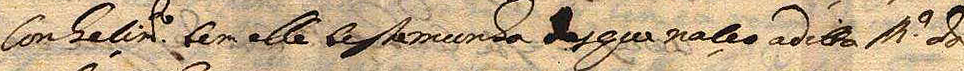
Conheçimto. tem elle testemunha des que naçeo a ditta M.a da
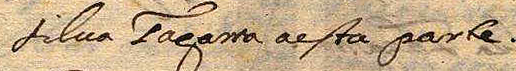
Silua Tagarra a esta parte.
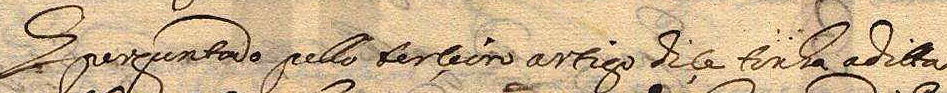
E perguntado pello terçeiro artigo diçe tinha a ditta
